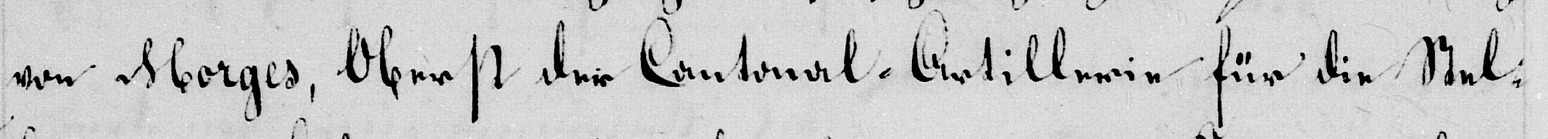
von Morges, Oberst der Cantonal-Artillerie für die Stel¬
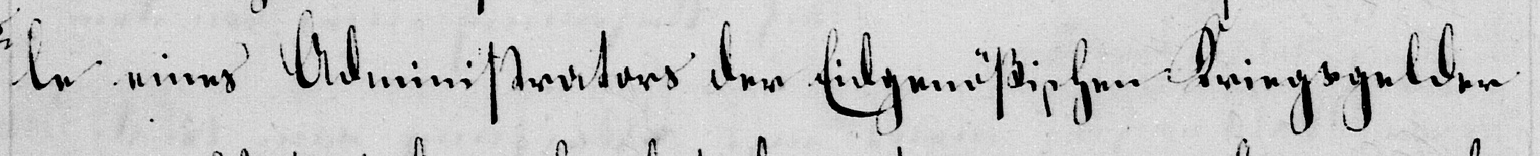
le eines Administrators der Eidgenößischen Kriegsgelder
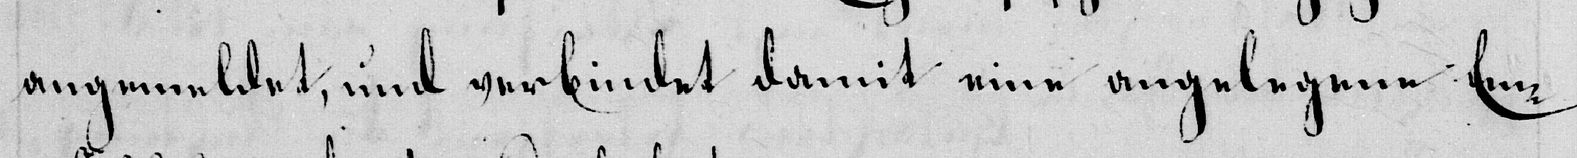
angemeldet, und verbindet damit eine angelegene Em¬
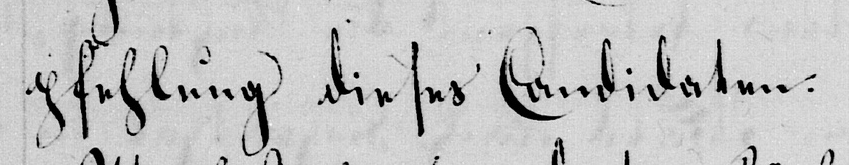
pfehlung dieses Candidaten.
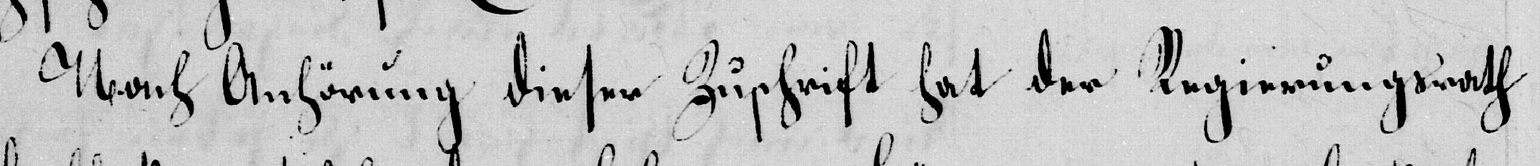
Nach Anhörung dieser Zuschrift hat der Regierungsrath
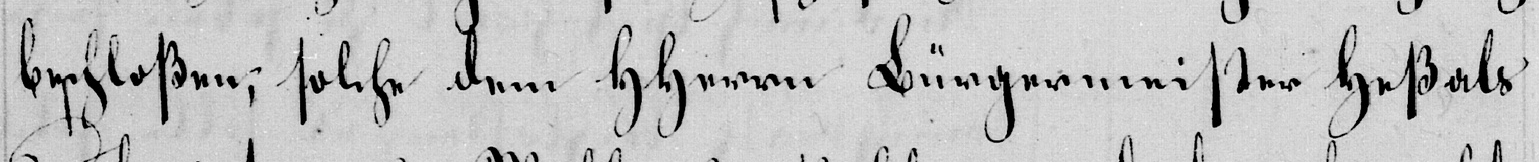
beschloßen, solche dem HHerrn Bürgermeister Heß als
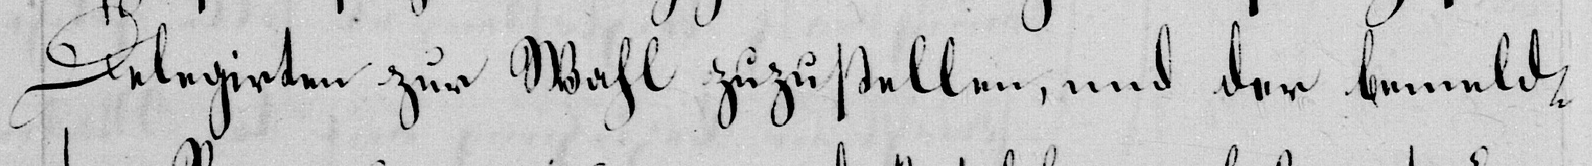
Delegirten zur Wahl zuzustellen, und der bemeld¬
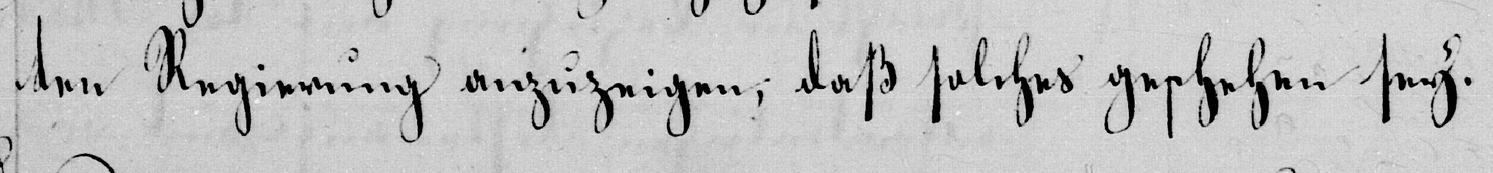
eten Regierung anzuzeigen, daß solches geschehen sey.
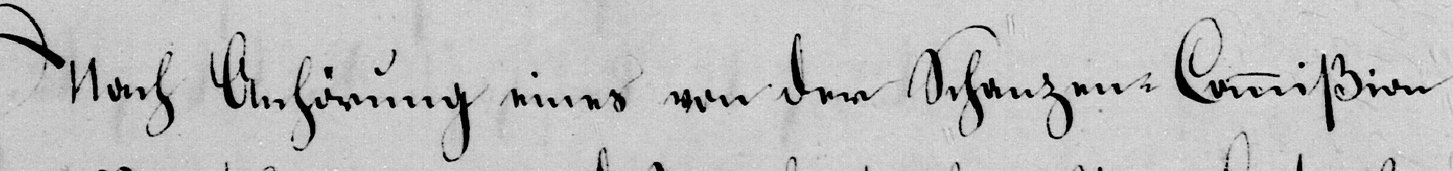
Nach Anhörung eines von der Schanzen-Commißion
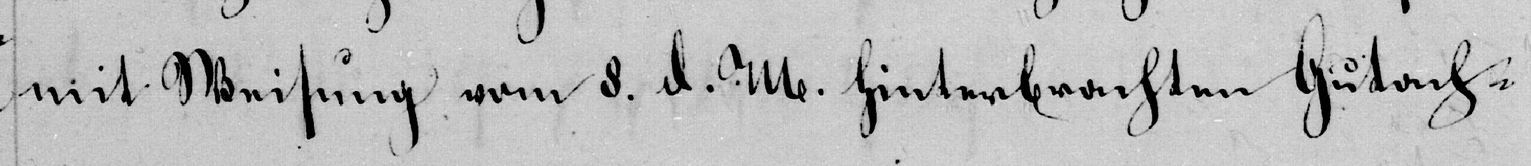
mit Weisung vom 8. d. M. hinterbrachten Gutach-
